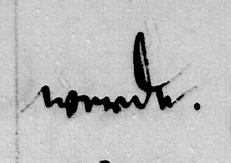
werde.
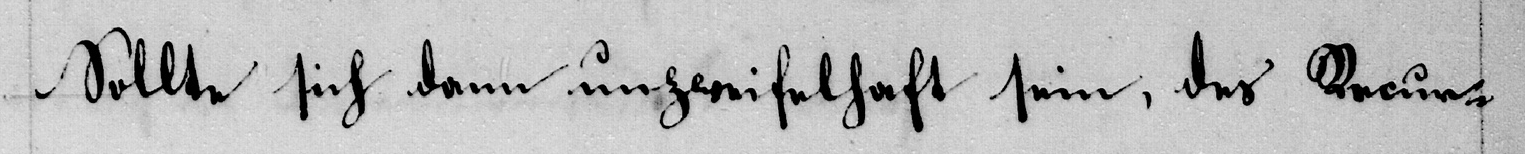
Sollte sich dann unzweifelhaft sein, des Recur¬
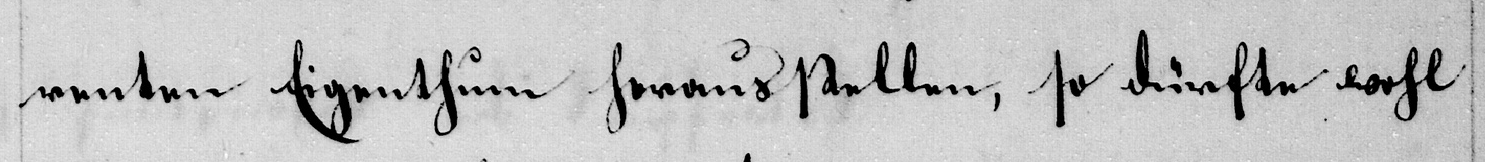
renten Eigenthum herausstellen, so dürfte wohl
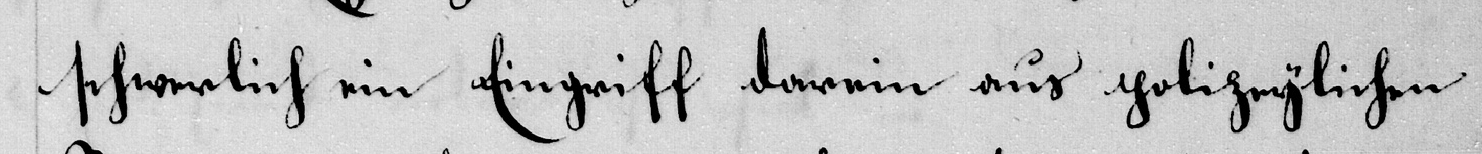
schwerlich ein Eingriff darein aus polizeylichen
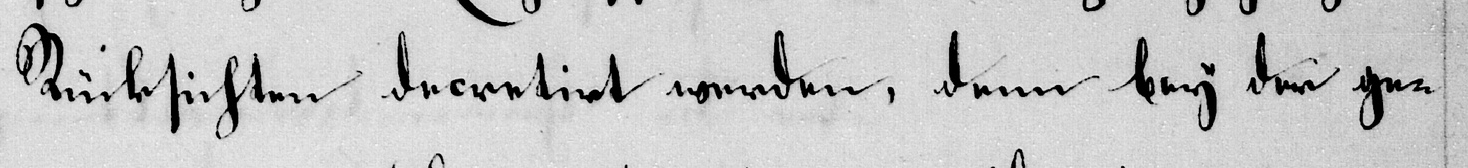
Rücksichten decretirt werden, denn bey der ge¬
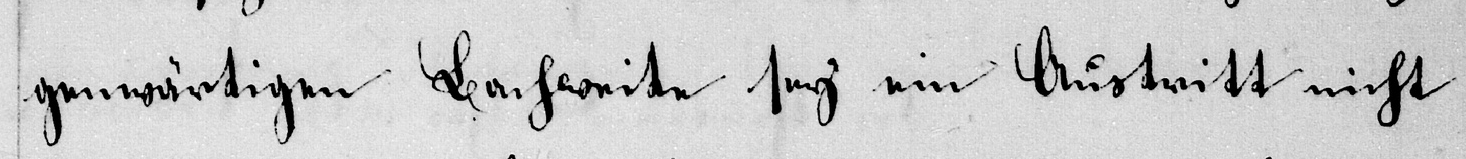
genwärtigen Bachweite sey ein Austritt nicht
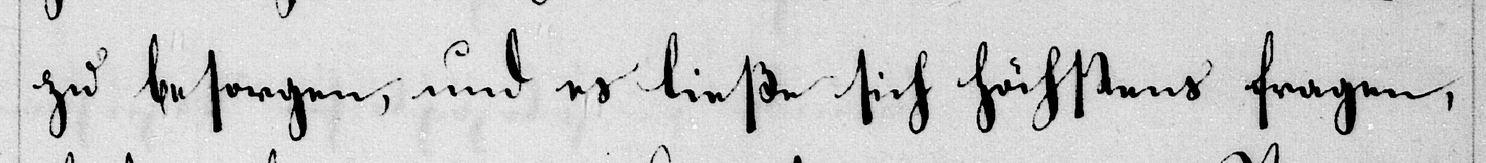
zu besorgen, und es ließe sich höchstens fragen,
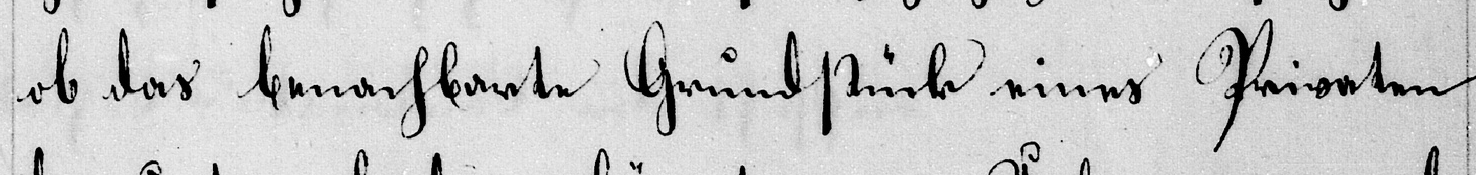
ob das benachbarte Grundstück eines Privaten
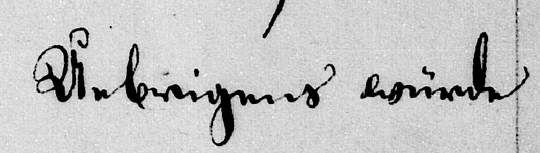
Uebrigens würde
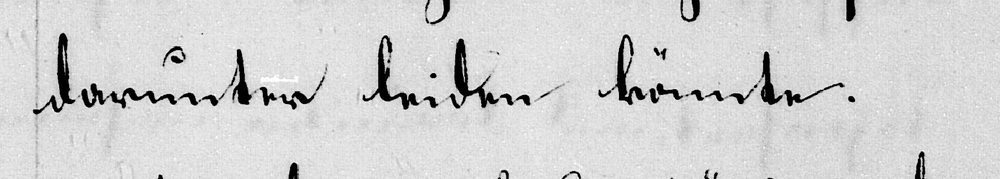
darunter leiden könnte.
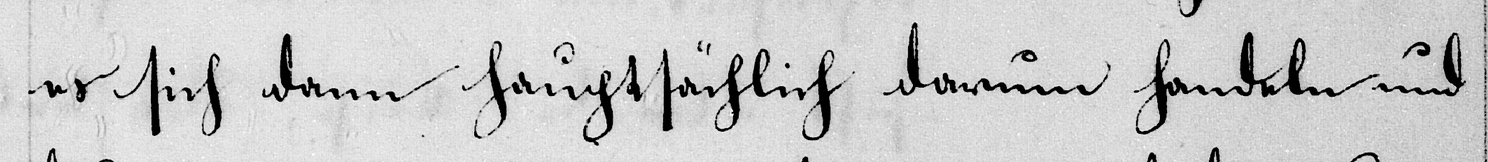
es sich dann hauptsächlich darum handeln und
